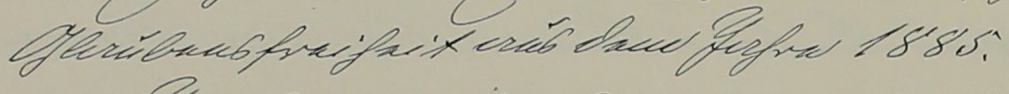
Glaubensfreiheit aus dem Jahre 1885.
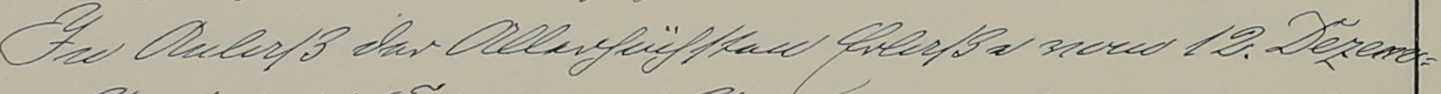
In Anlaß der Allerhöchsten Erlaße vom 12. Dezem-
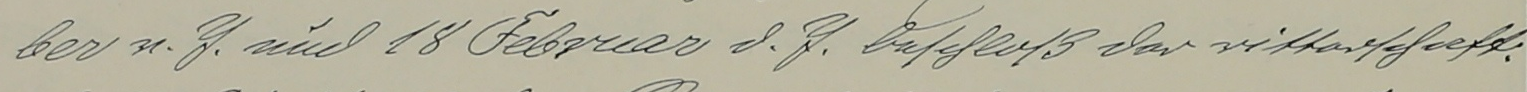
ber v.J. und 18. Februar d.J. beschloß der ritterschaft-
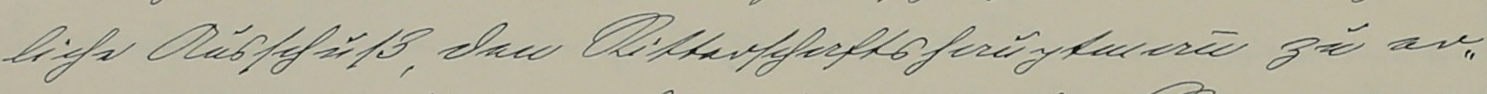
liche Ausschuß, den Ritterschaftshauptmann zu er-
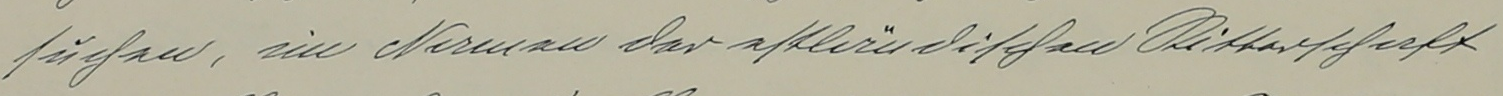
suchen, im Namen der estländischen Ritterschaft
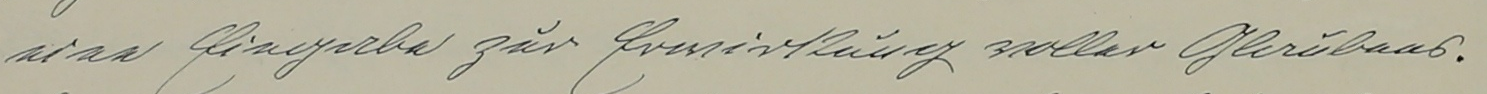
eine Eingabe zur Erwirkung voller Glaubens-
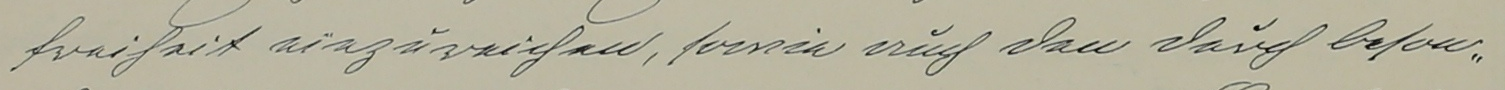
freiheit einzureichen, sowie auch den durch beson-
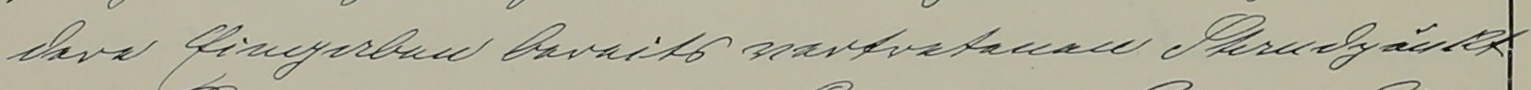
dere Eingaben bereits vertretenen Standpunkt
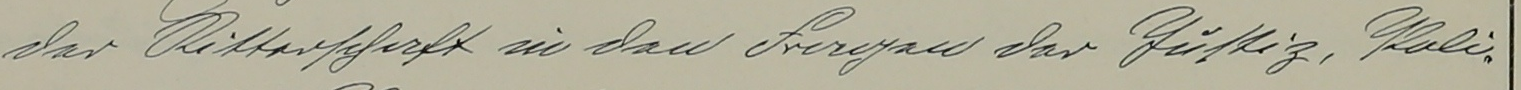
der Ritterschaft in den Fragen der Justiz, Poli-
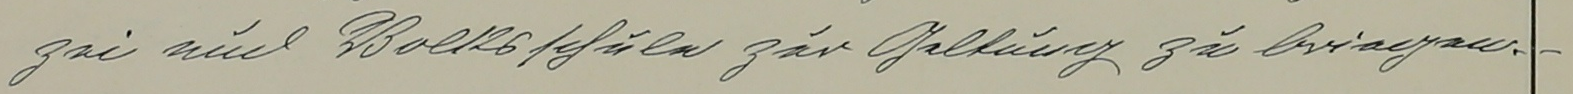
zei und Volksschule zur Geltung zu bringen.
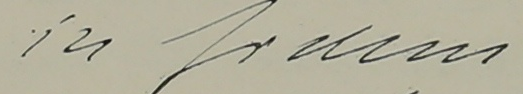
in fidem
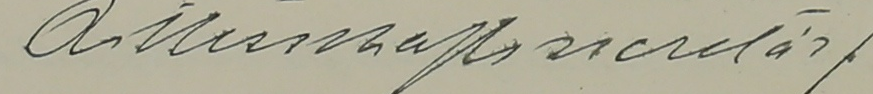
Ritterschaftssecretär
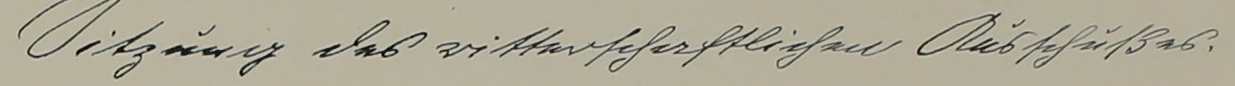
Sitzung des ritterschaftlichen Ausschußes.
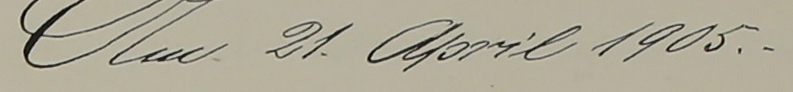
Am 21. April 1905.
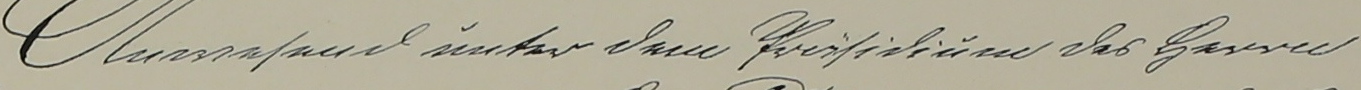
Anwesend unter dem Präsidium des Herrn
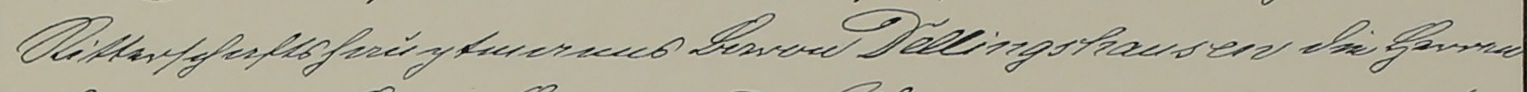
Ritterschaftshauptmanns Baron Dellingshausen die Herren
